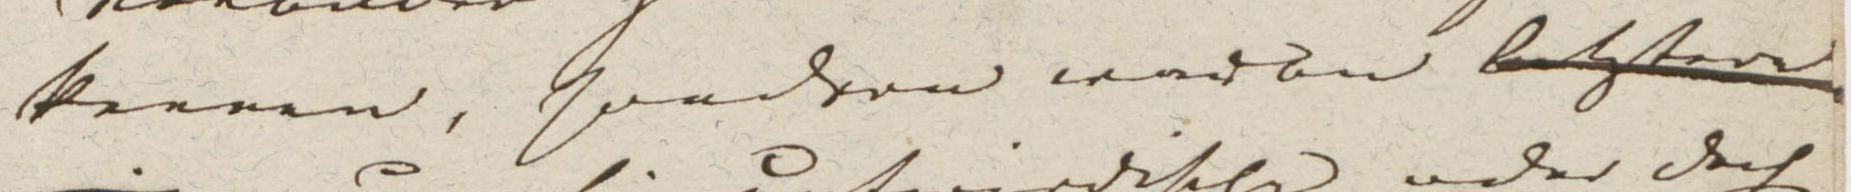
kennen, sondern waren letztere
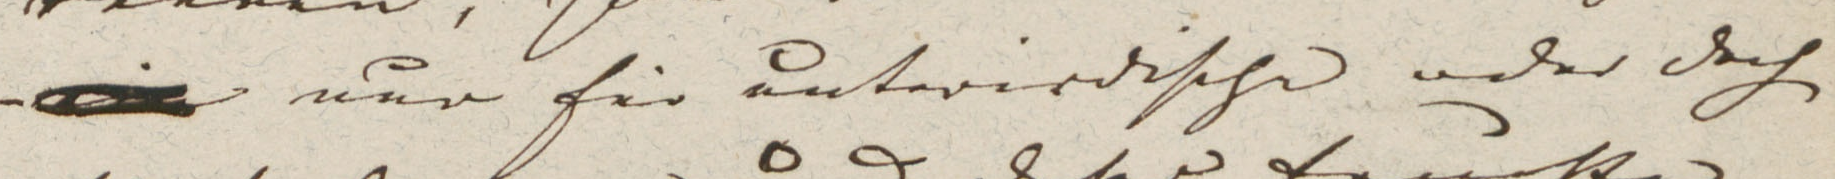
diese ein nur für unterirdische oder doch
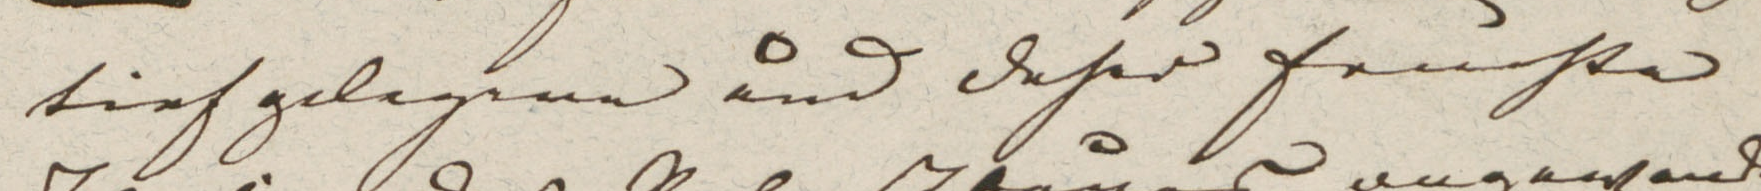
tief gelegene und daher feuchte
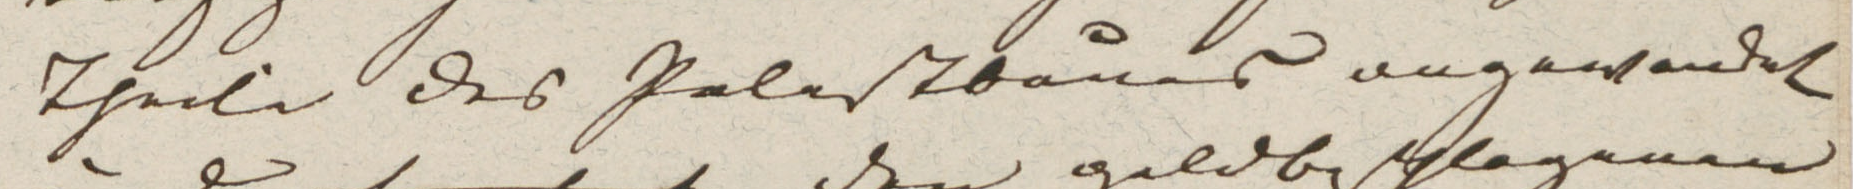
Theile des Palastbaues angewendet
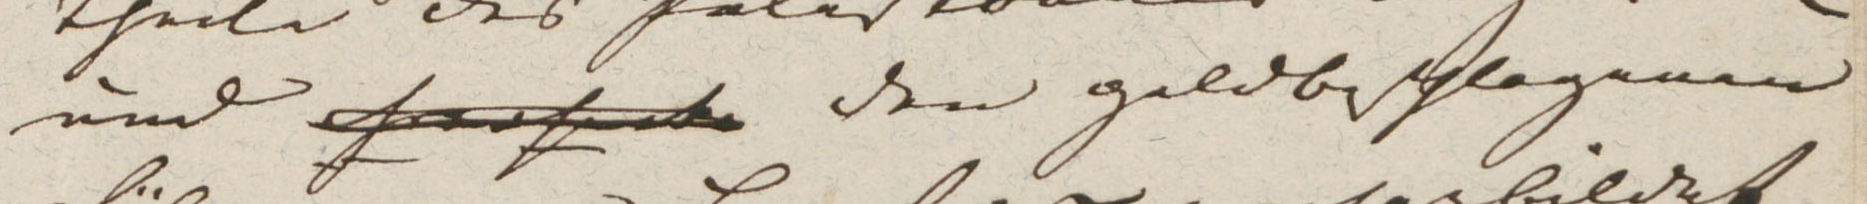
und ihrerseit den goldbeschlagenen
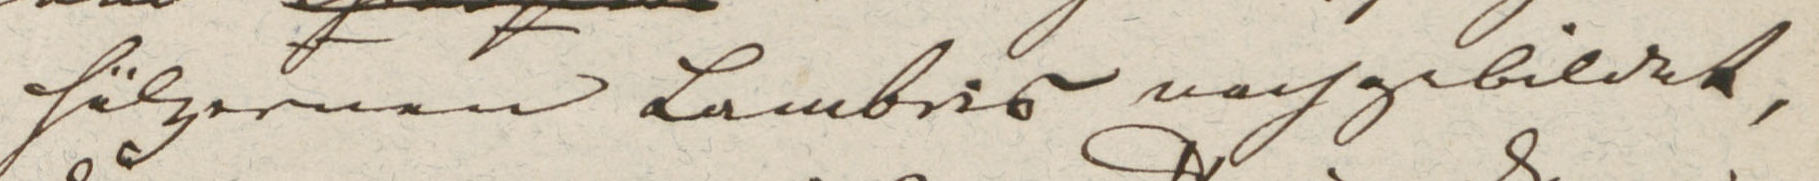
hölzernen Lambris nachgebildet,
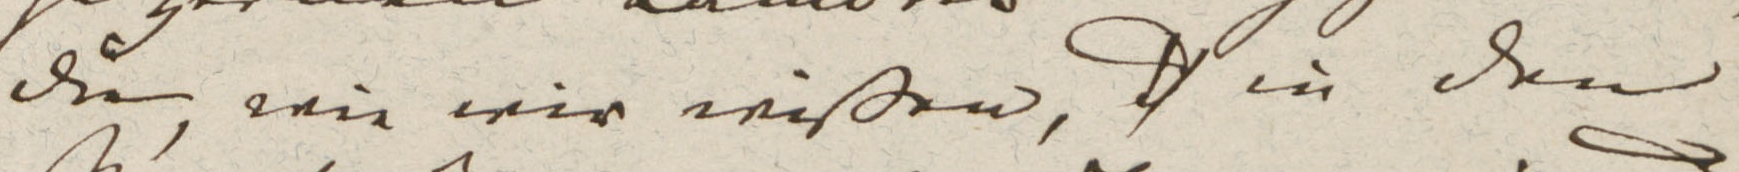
die, wie wir wissen, d in den
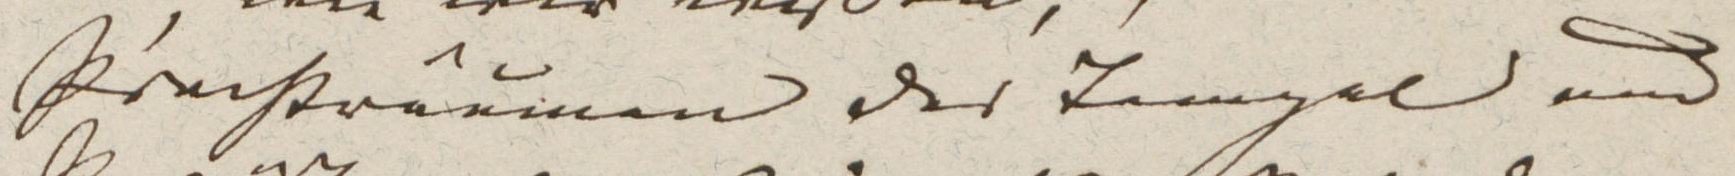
Prachträumen der Tempel und
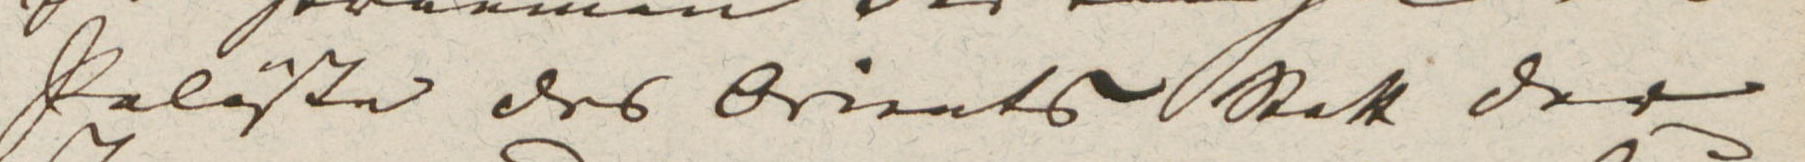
Paläste des Orients Statt der
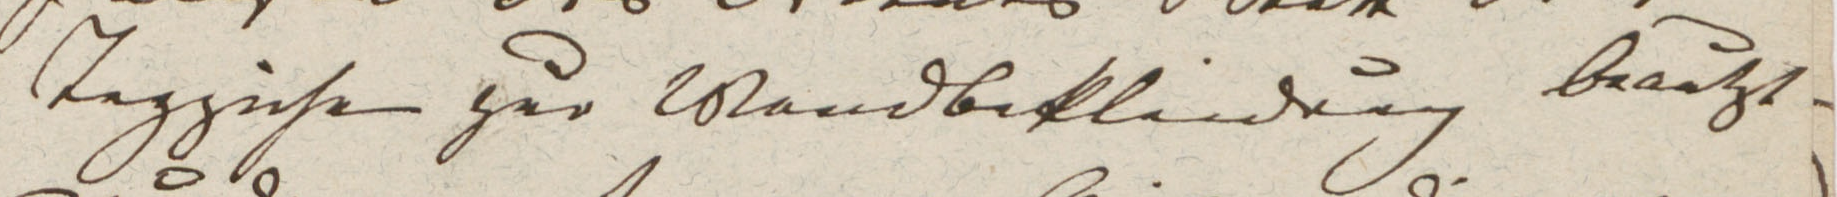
Teppiche zur Wandbekleidung benutzt
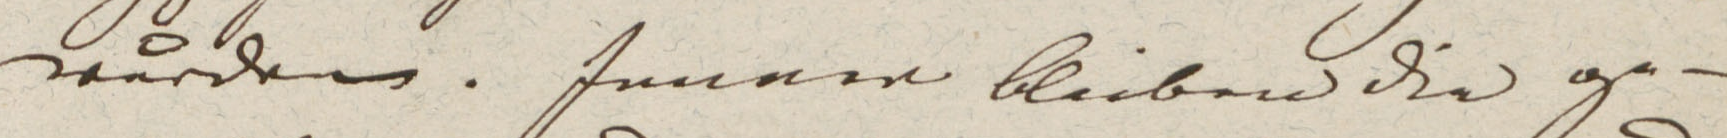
wurden. Immer blieben die ge-
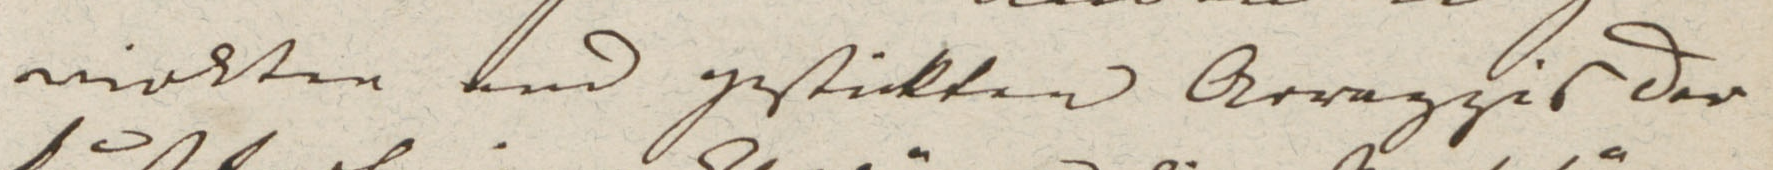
wirkten und gestickten Arrazzis der
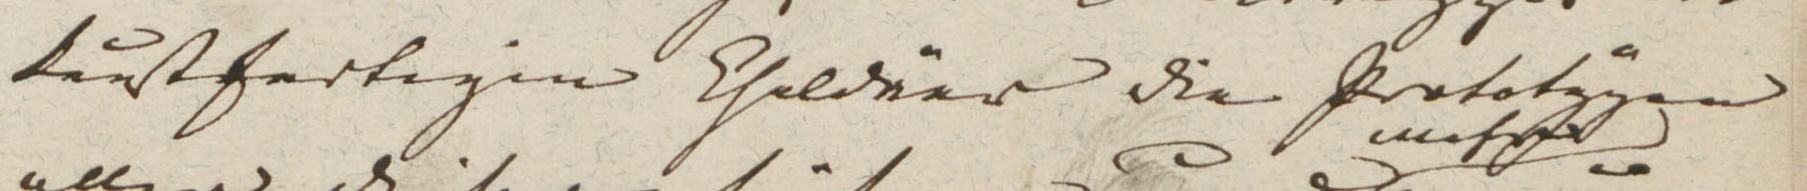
kunstfertigen Chaldäer die Prototypen
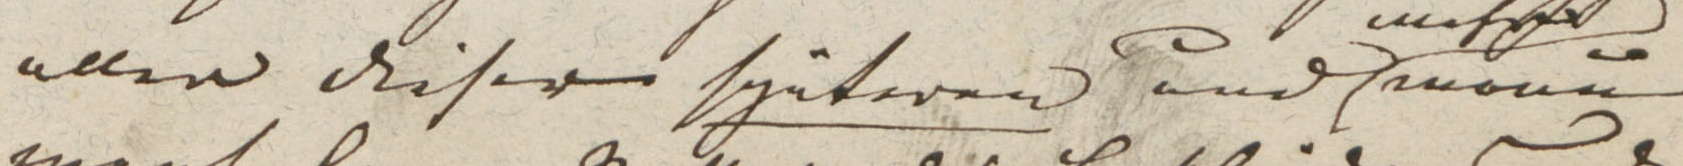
aller dieser späteren und mehr monu-
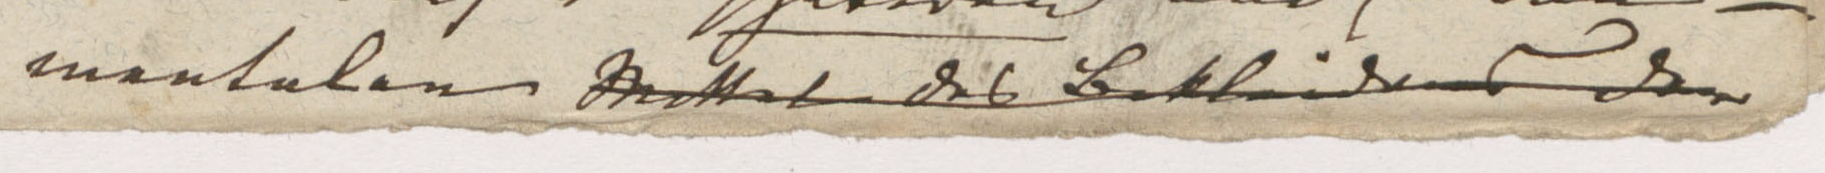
mentalen Mittel des Bekleidens der
